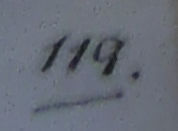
119.
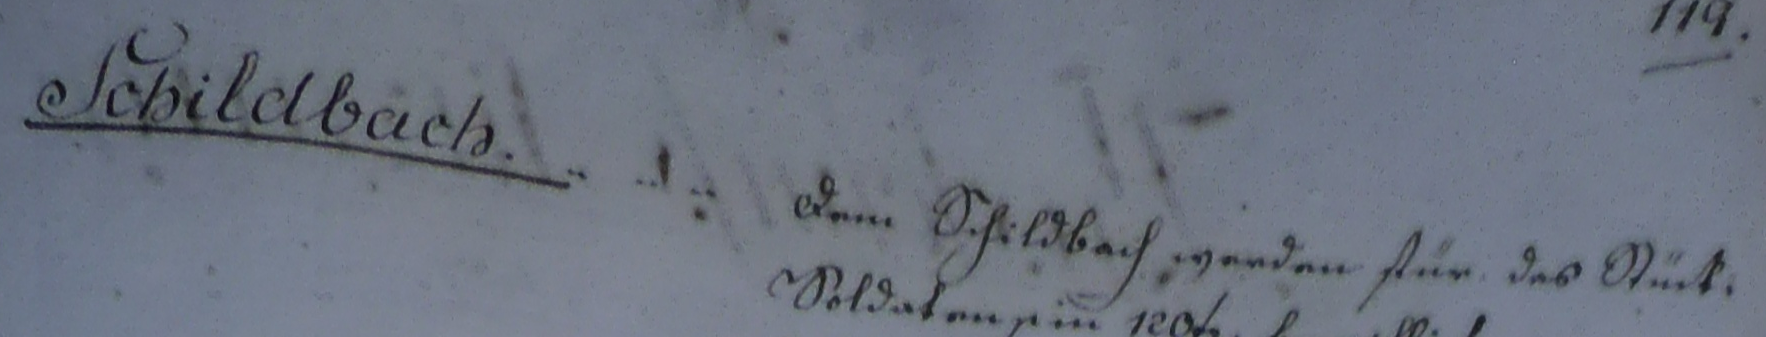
Schildbach. .. .. .. Dem Schildbach werden für das Stück:
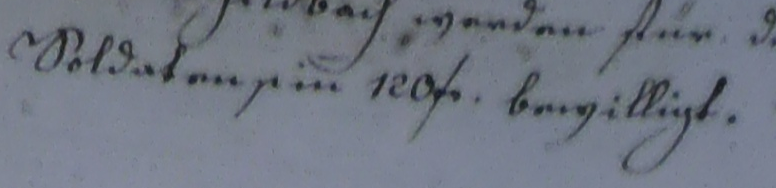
Soldatensin̅ 120fr. bewilligt.
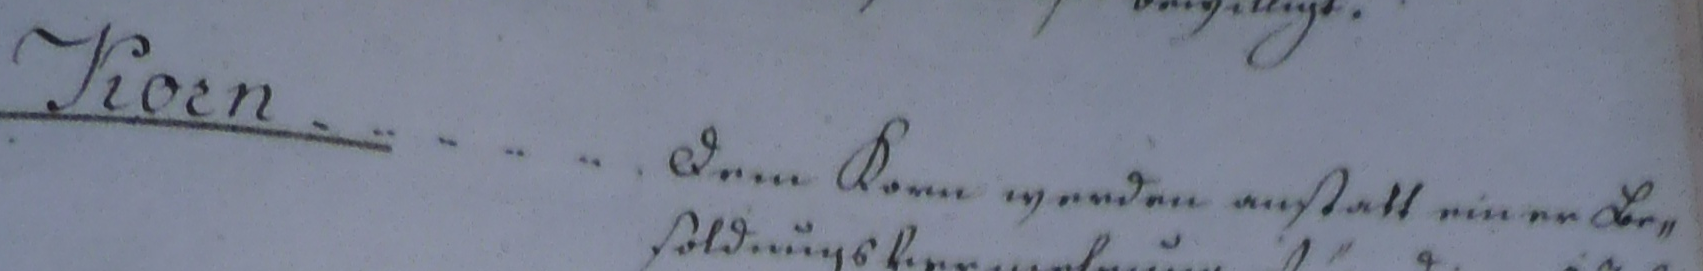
Korn .. .. .. .. .. Dem Korn werden anstatt einer Be¬
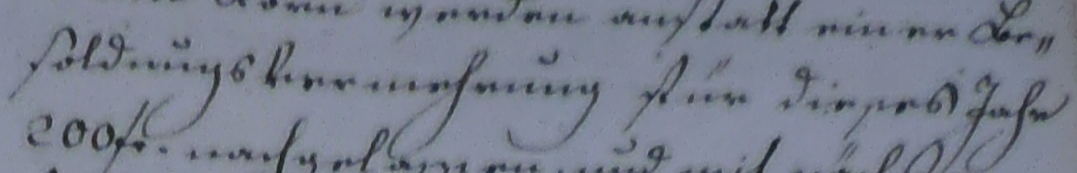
soldungsvermehrung für dieses Jahr
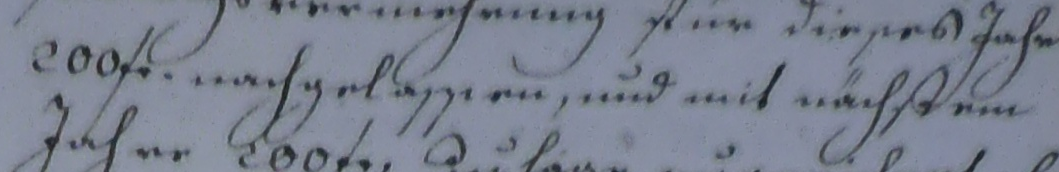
200fr. nachgelassen, und mit nächstem
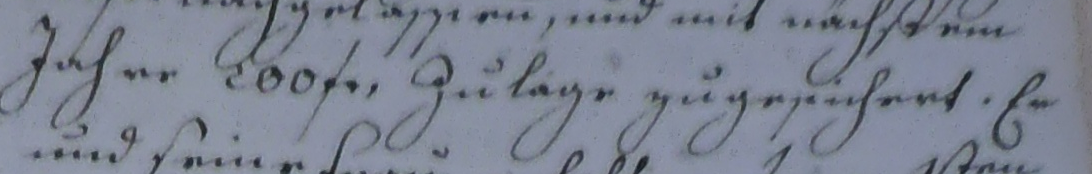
Jahre 200fr. Zulage zugesichert. Er
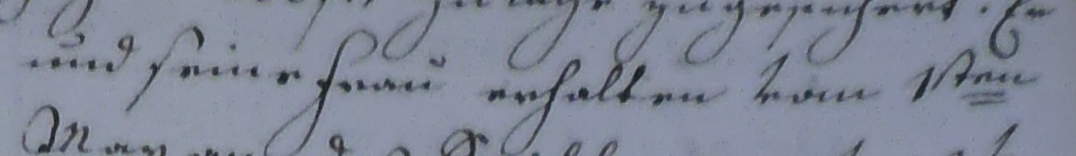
und seine Frau erhalten vom 1ste͇n
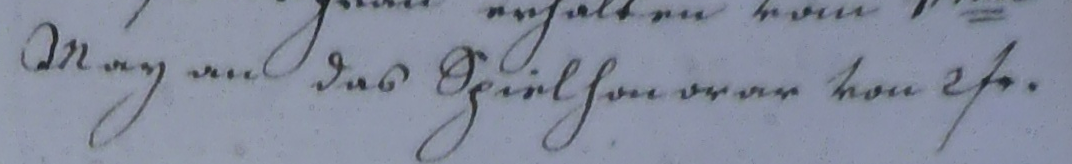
May an das Spielhonorar von 2fr.
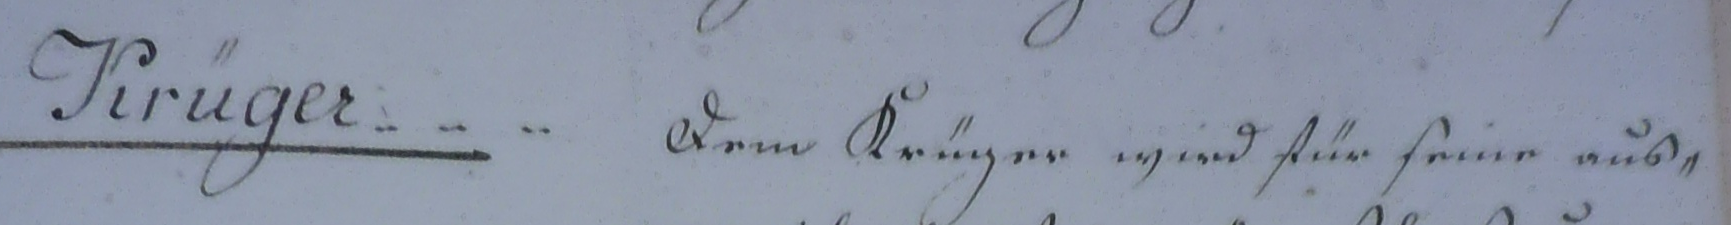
Krüger .. .. .. Dem Krüger wird für seine aus¬
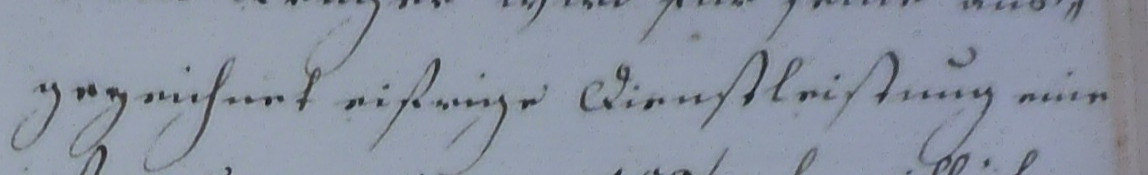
gezeichnet eifrige Dienstleistung eine
